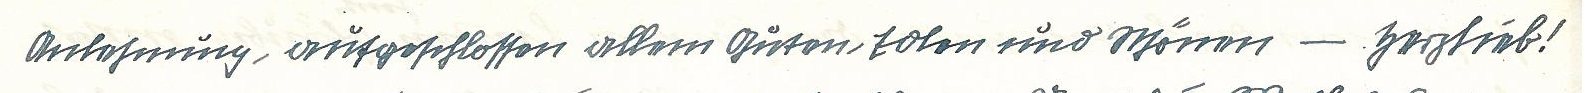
Anlehnung, aufgeschlossen allem Guten, Edlen und Schönen – Herzlieb!
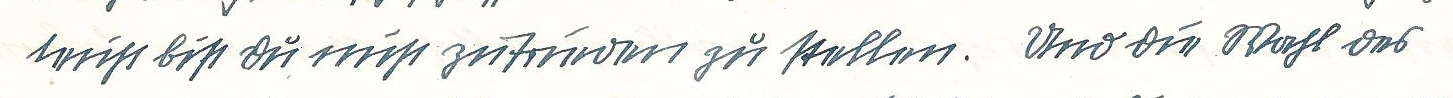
eist bist Du nicht zufrieden zu stellen. Und die Wahl des
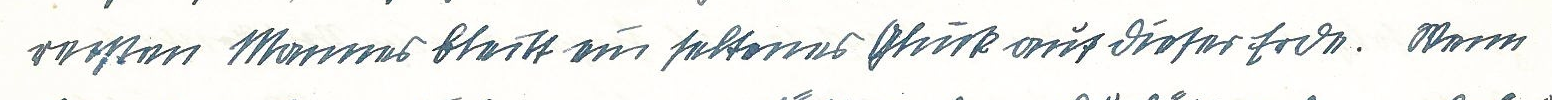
rechten Mannes bleibt ein seltenes Glück auf dieser Erde. Wenn
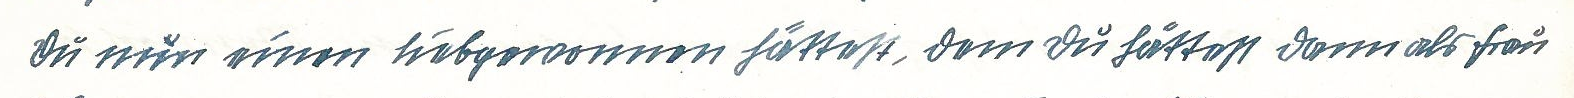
Du nun einen lieb gewonnen hättest, dem Du hättest dann als Frau
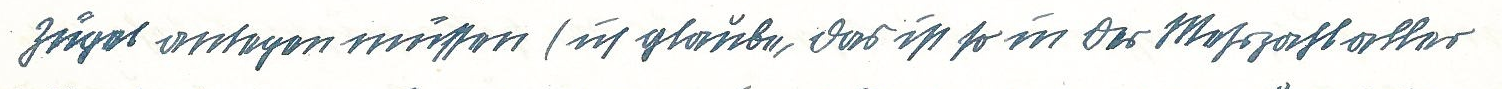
Zügel anlegen müssen (ich glaube, das ist so in der Mehrzahl aller
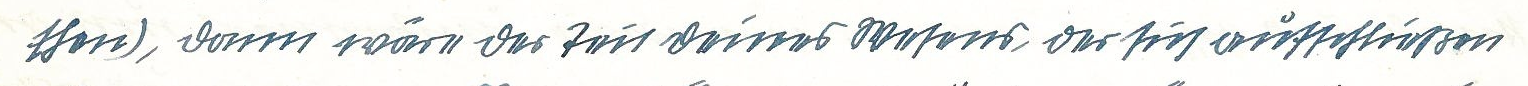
Ehen), dann wäre der Teil Deines Wesens, der sich aufschließen
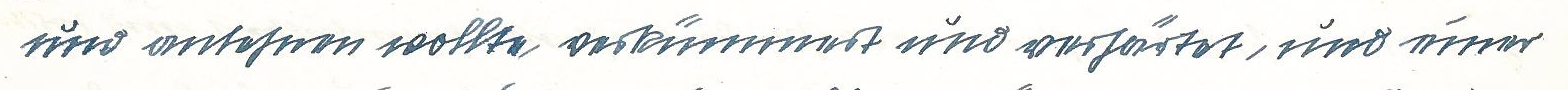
und anlehnen wollte, verkümmert und verhärtet, und einer
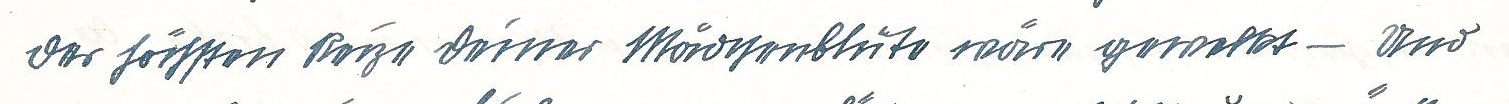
der höchsten Reize, Deine Mädchenblüte wäre gewelkt. – Und
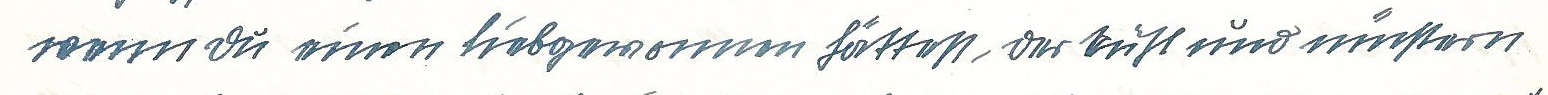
wenn Du einen lieb gewonnen hättest, der kühl und nüchtern
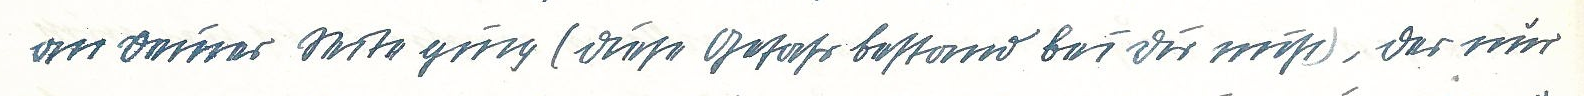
an Deiner Seite ging (diese Gefahr bestand bei Dir nicht), der nur
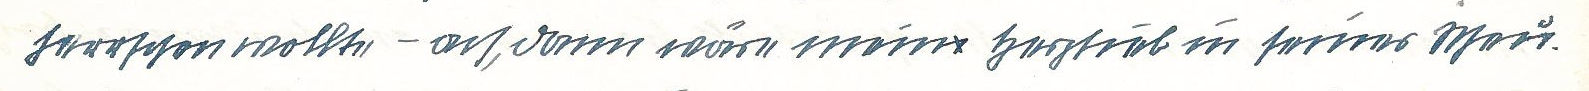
herrschen wollte – ach, dann wäre meimn Herzlieb in seiner Scheu
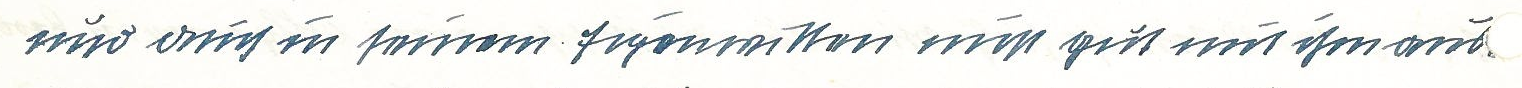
und auch in seinem Eigenwillen nicht gut mit ihm aus¬
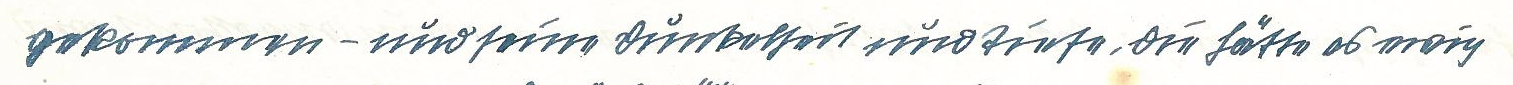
gekommen – und seine Dunkelheit und Tiefe, die hätte es ewig
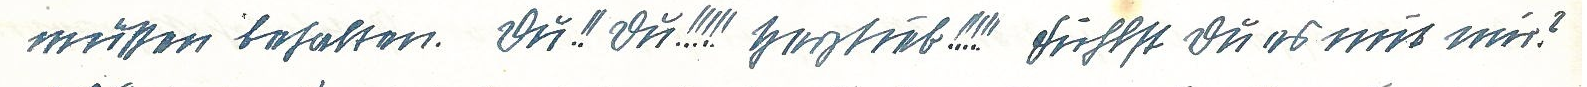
müssen behalten. Du!! Du!!!!! Herzlieb!!!!! fühlst Du es mit mir?
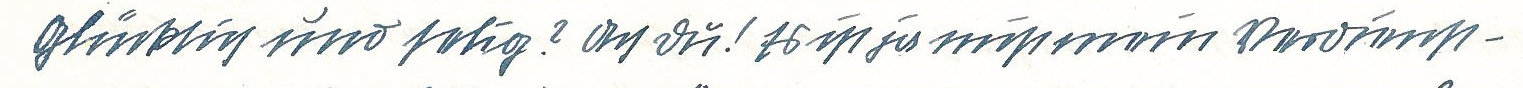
Glücklich und selig? Ach Du! Es ist ja nicht mein Verdienst –
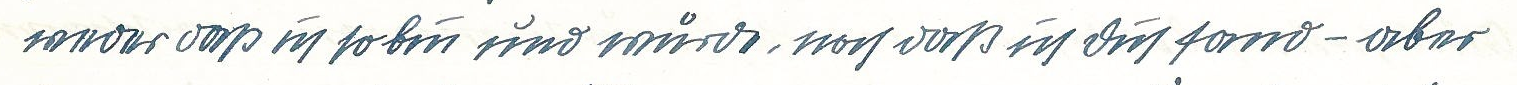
weder daß ich nicht so bin und wurde, noch daß ich Dich fand – aber
